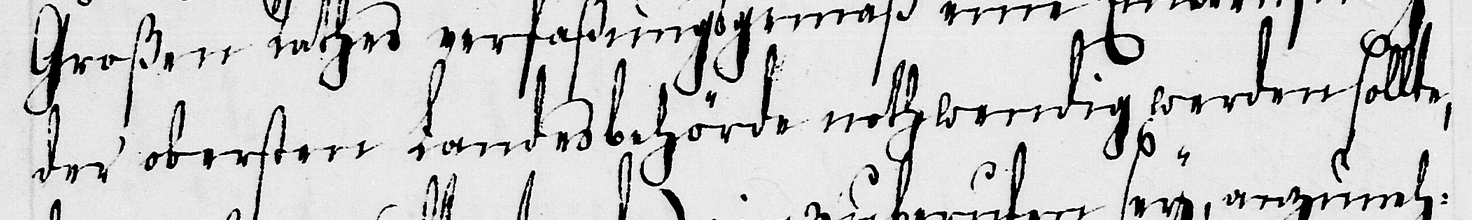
der obersten Landesbehörde nothwendig werden sollte,
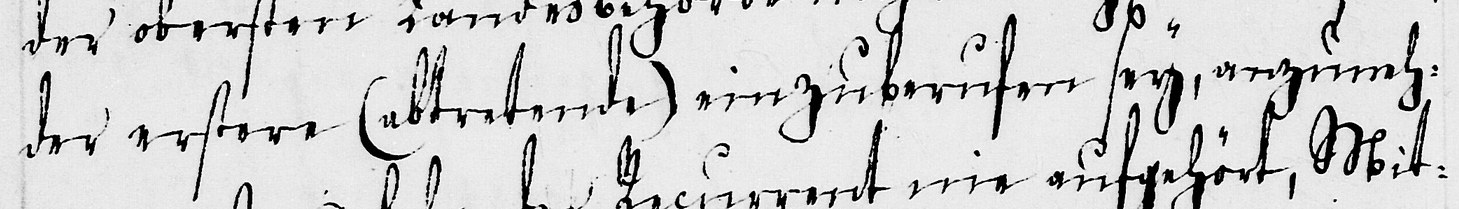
der erstere (abtretende) einzuberufen sey, anzuneh¬
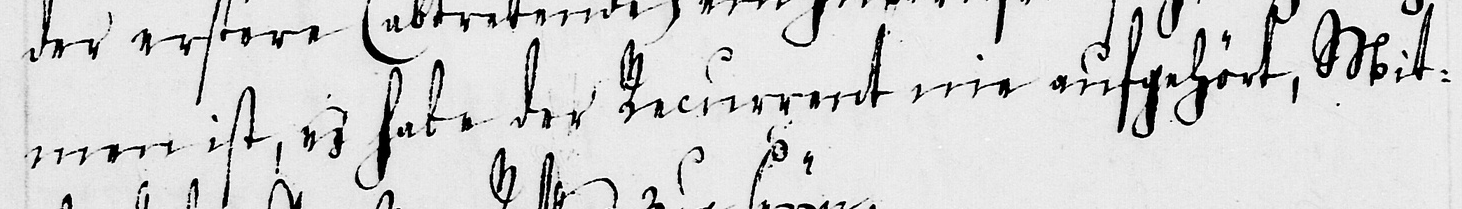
men ist, es habe der Recurrent nie aufgehört, Mit¬
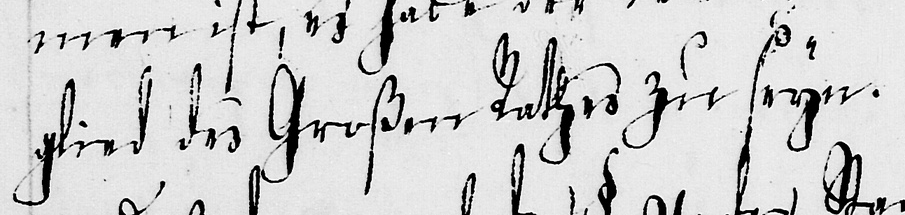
glied des Großen Rathes zu seyn.
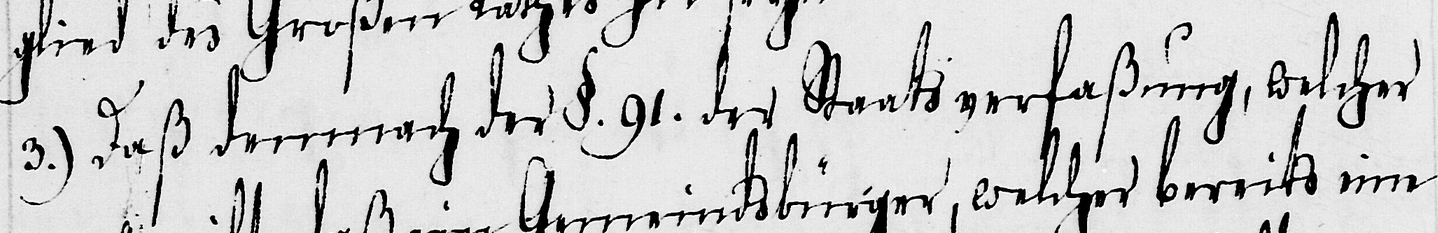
3.) Daß demnach der §. 91. der Staatsverfaßung, welcher
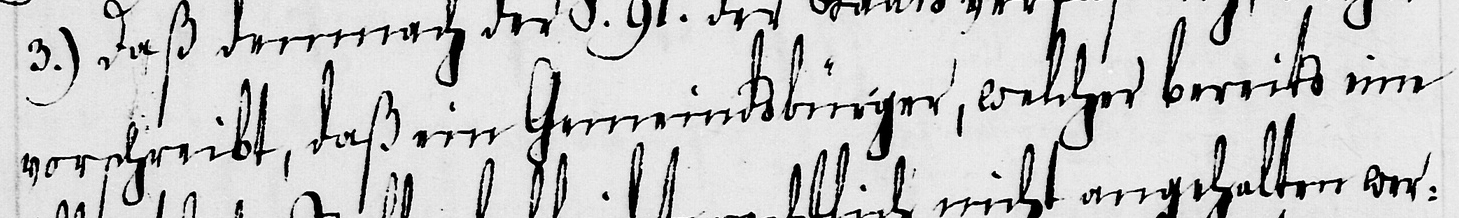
vorschreibt, daß ein Gemeindsbürger, welcher bereits eine
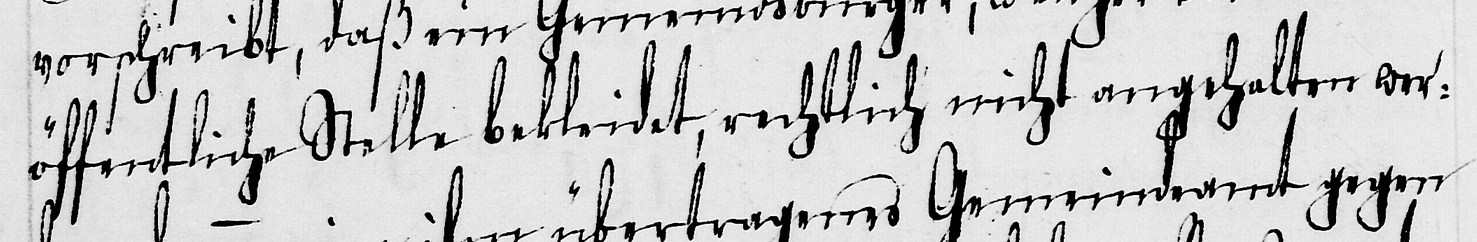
öffentliche Stelle bekleidet, rechtlich nicht angehalten wer¬
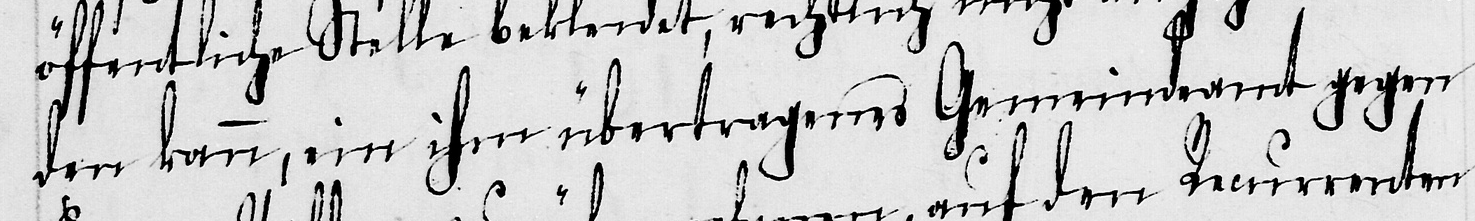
den kann, ein ihm übertragenes Gemeindeamt gegen
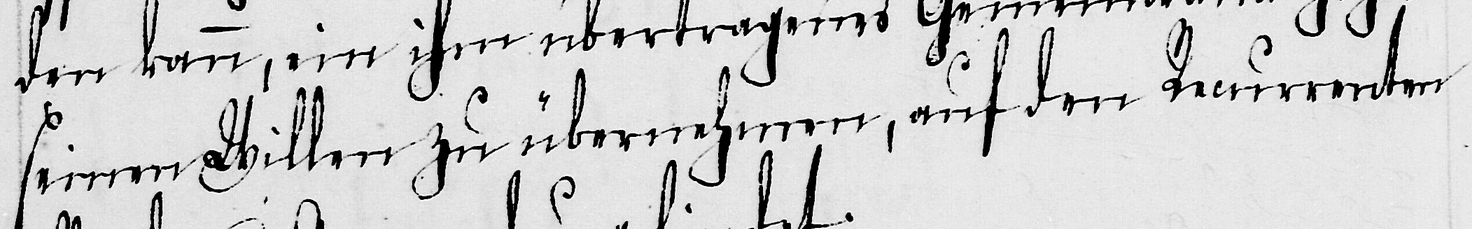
seinen Willen zu übernehmen, auf den Recurrenten
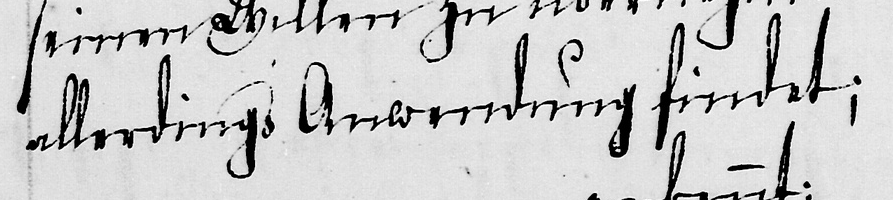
allerdings Anwendung findet;
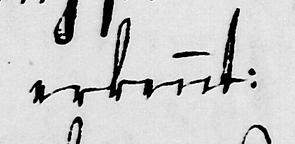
erkennt:
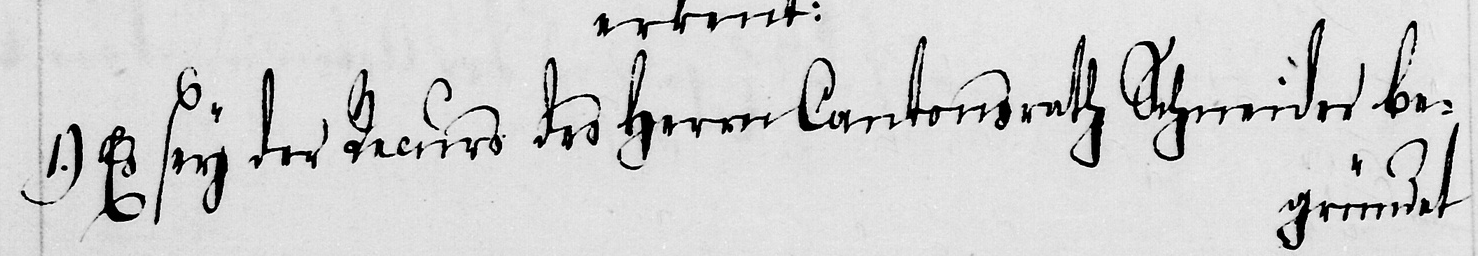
1.) Es sey der Recurs des Herrn Cantonsrath Schneider be-
